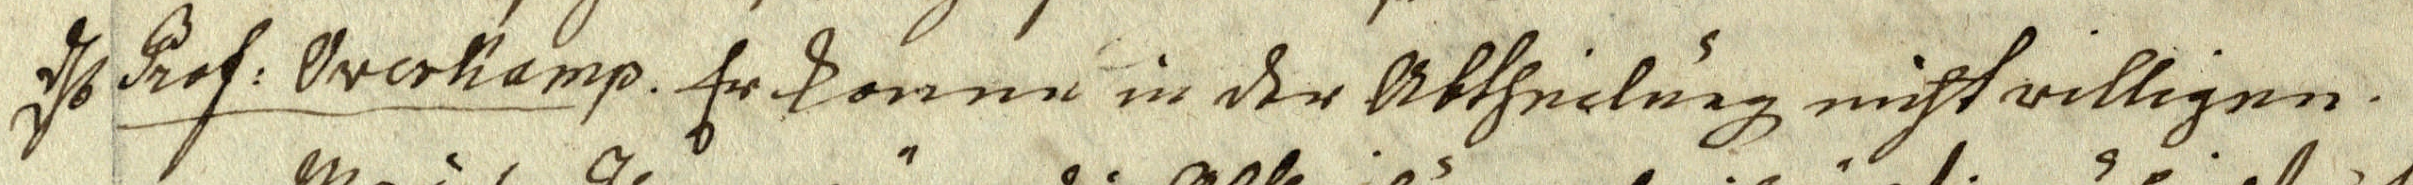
dh. Prof. Overkamp. Er könne in der Abtheilung nicht willigen.
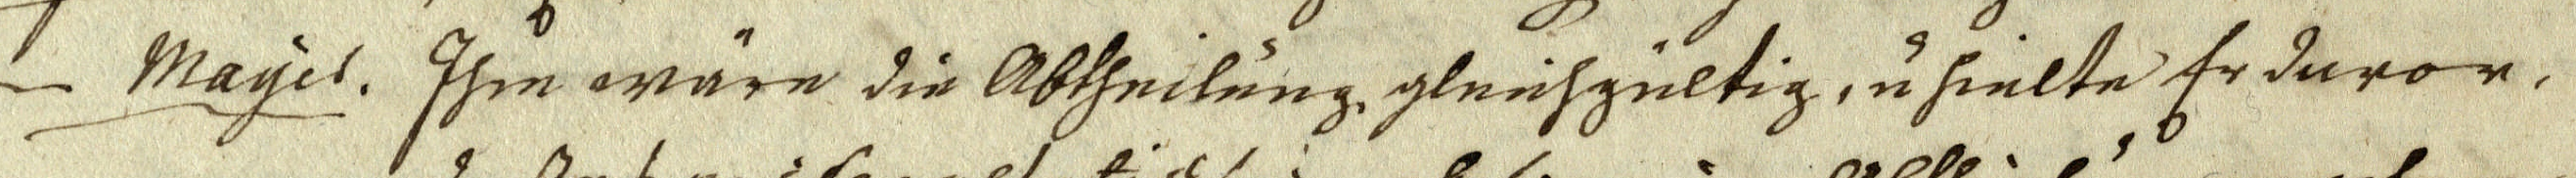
Maÿer. Ihm wäre die Abtheilung gleichgültig, u hielte Er davor,
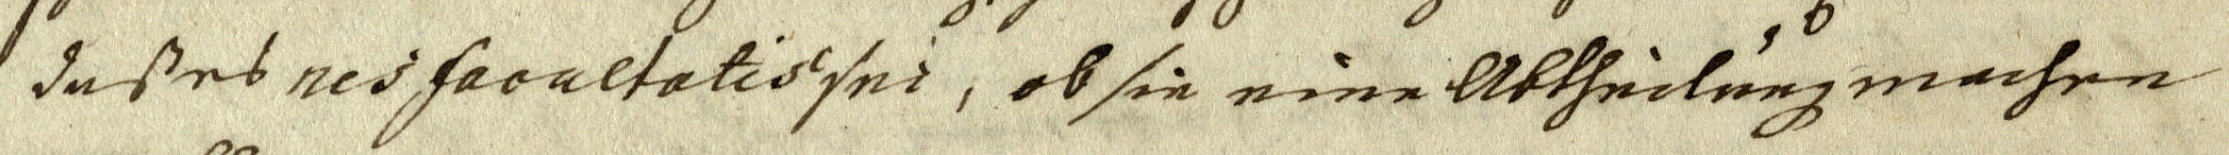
daß es nes facultatis sei, ob sie eine Abtheilung machen
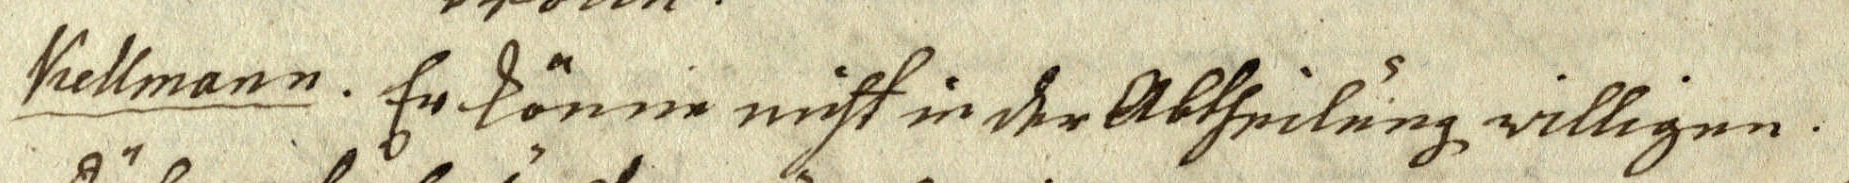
Kellmann. Er könne nicht in der Abtheilung willigen.
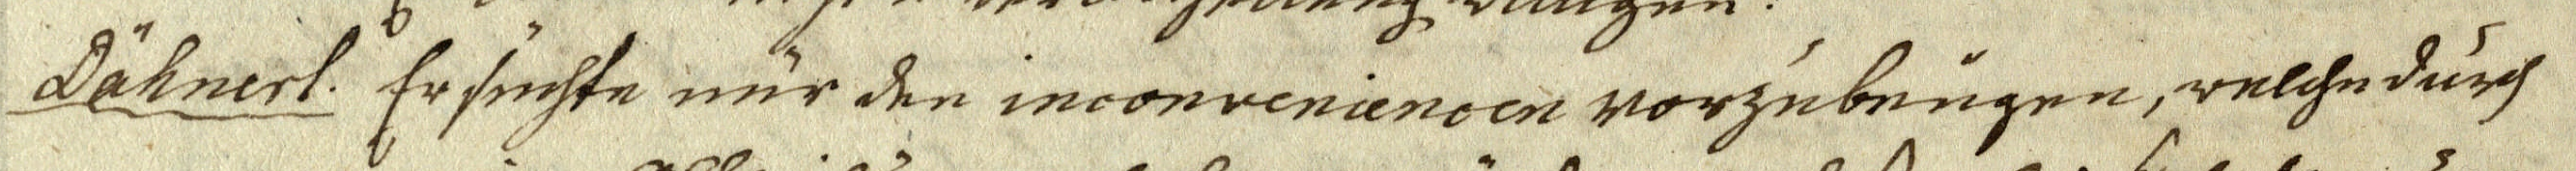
Dähnert. Er suchte nur den inconveniencen vorzubeugen, welche durch
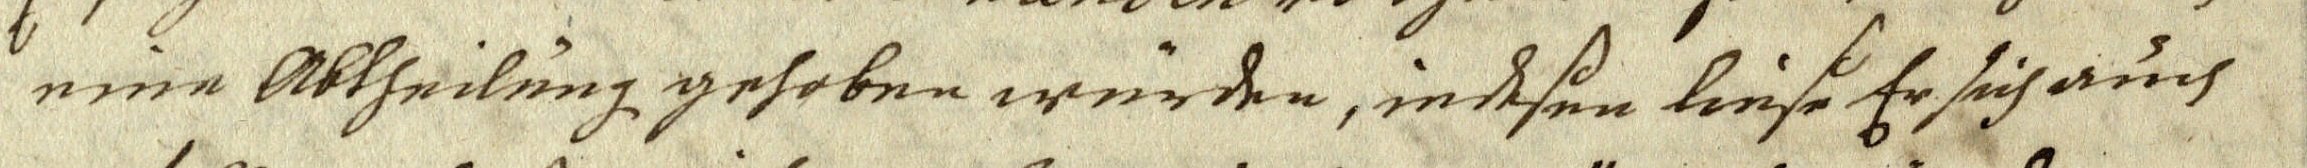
eine Abtheilung gehoben würden, indeßen ließe Er sich auch
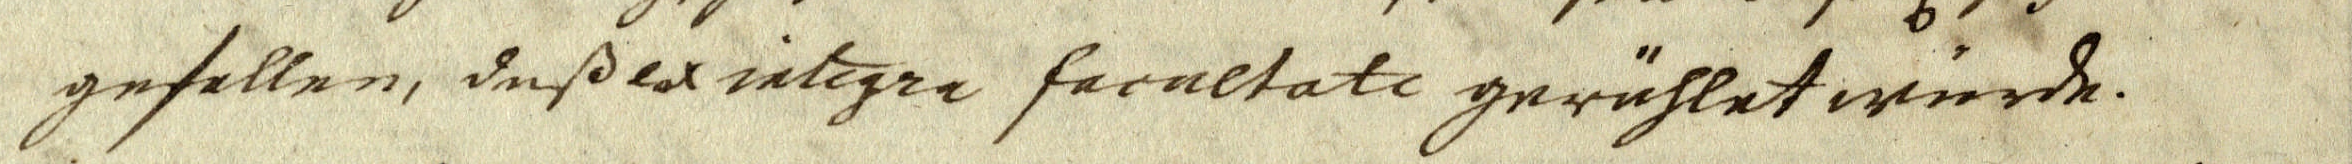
gefallen, daß ex integra facultate gewählet würde.
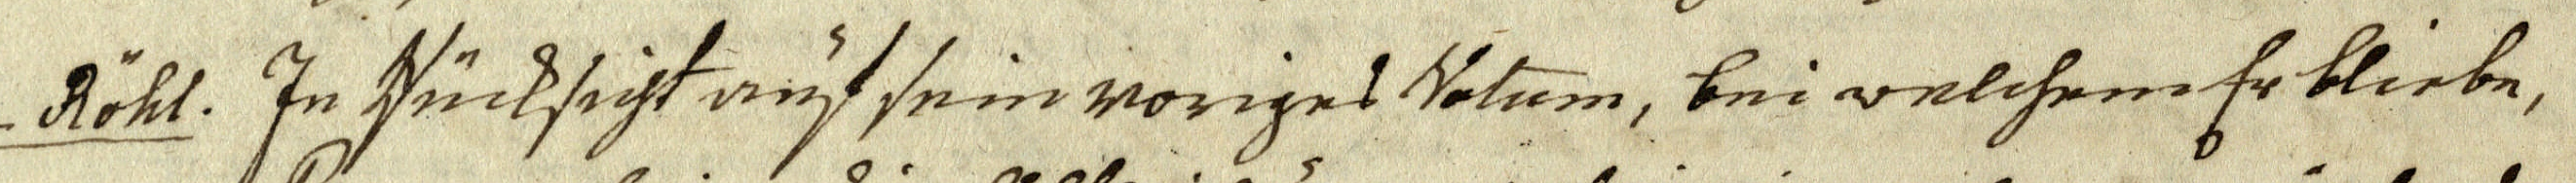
Röhl. In Rücksicht auf sein voriges Votum, bei welchem Er bliebe,
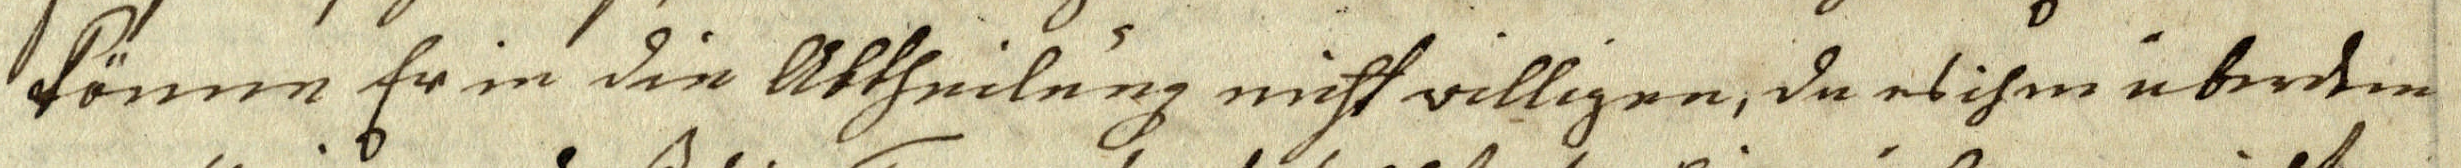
könne Er in die Abtheilung nicht willigen, da es ihm überdem
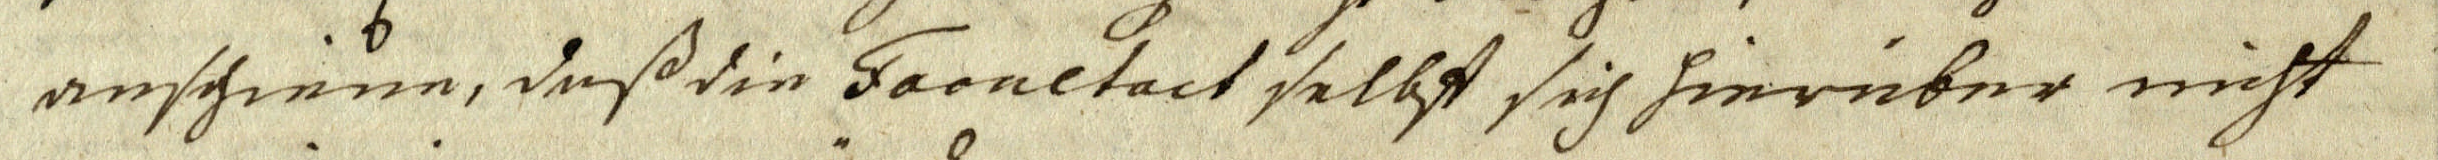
anschiene, daß die Facultaet selbst sich hierüber nicht
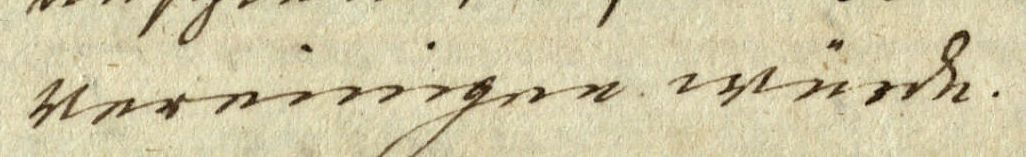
vereinigen würde.
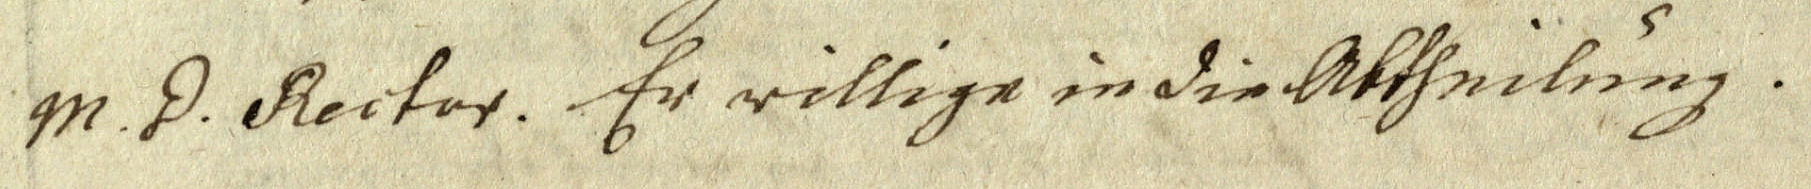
M. D. Rector. Er willige in die Abtheilung.
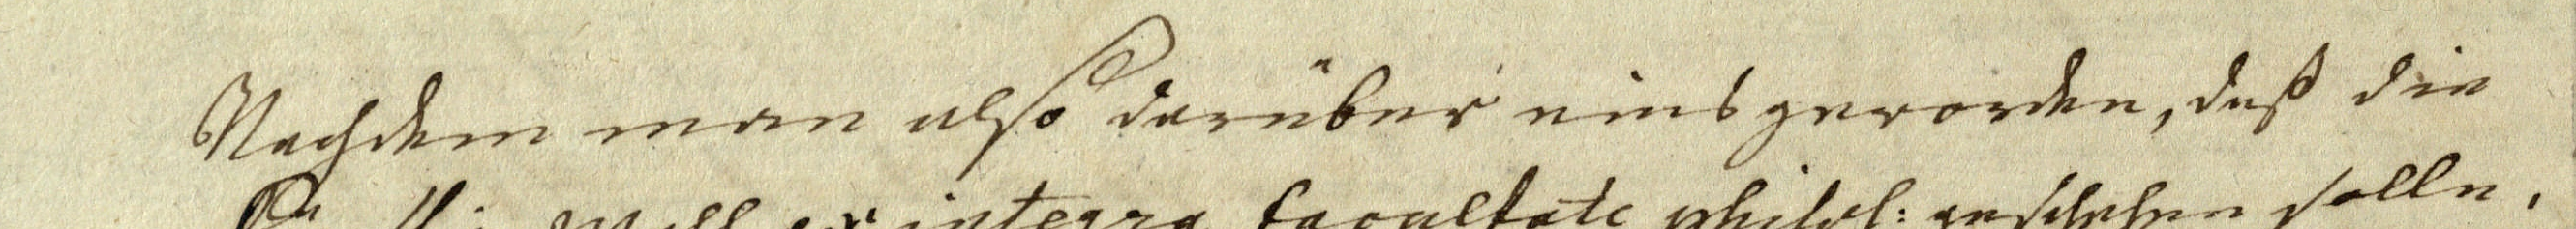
Nachdem man also darüber eins geworden, daß die
